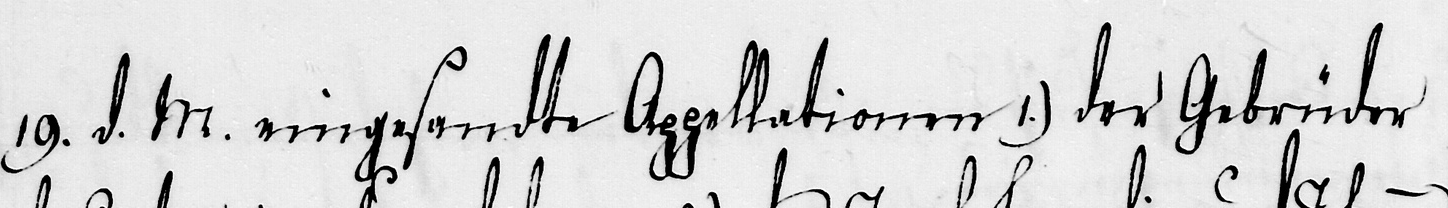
19. d. M. eingesandte Appellationen 1.) der Gebrüder
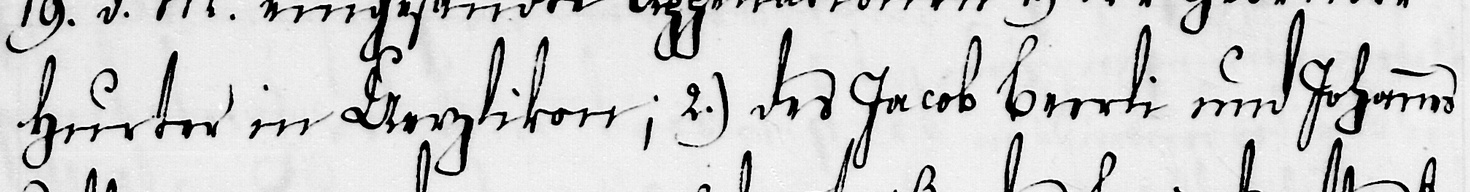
Hurter in Uerzlikon; 2.) des Jacob Beerli und Johannes
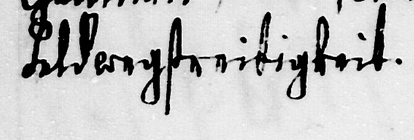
ldwegstreitigkeit.
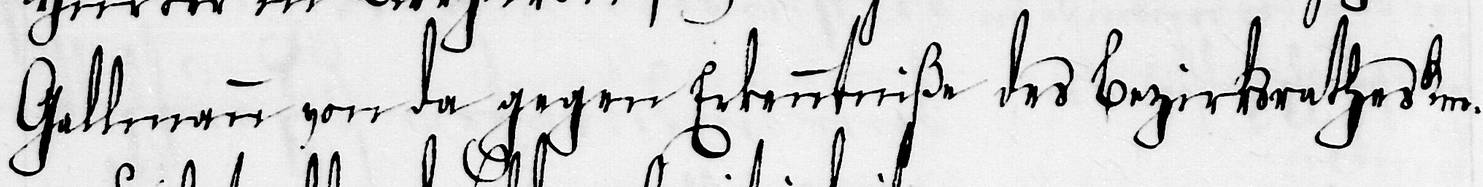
Gallmann von da gegen Erkenntniße des Bezirksrathes Kno¬
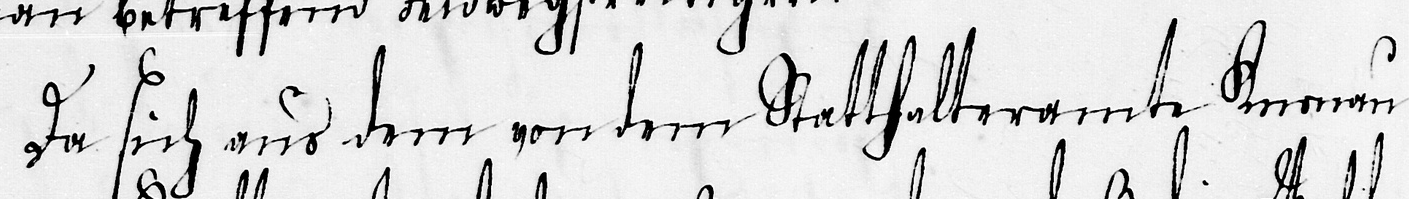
Da sich aus dem von dem Statthalteramte Knonau
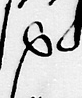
15.
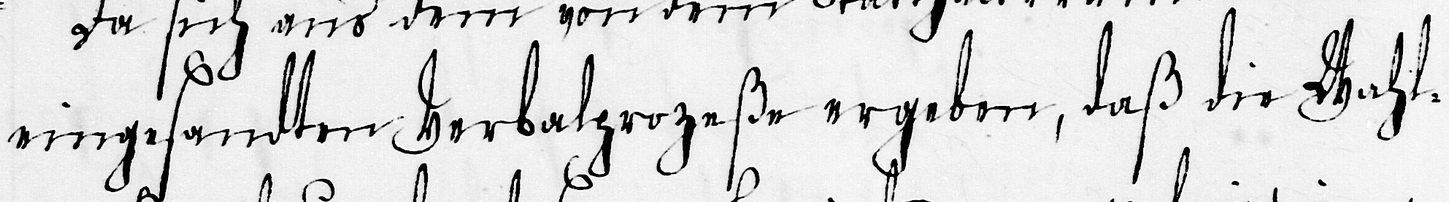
eingesandten Verbalprozeße ergeben, daß die Wahl¬
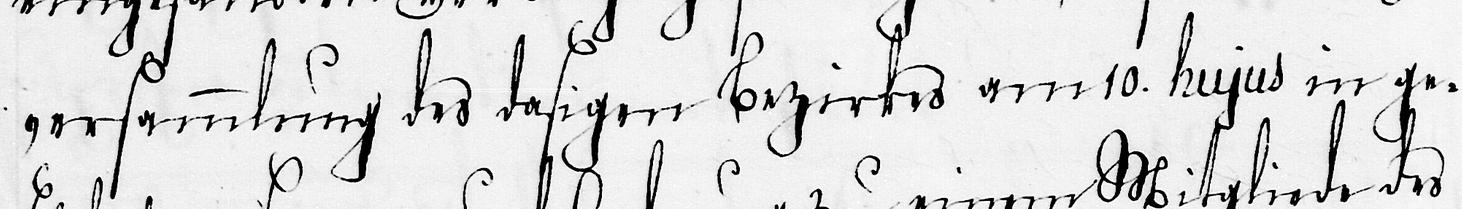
versammlung des dasigen Bezirkes am 10. hujus in ges¬
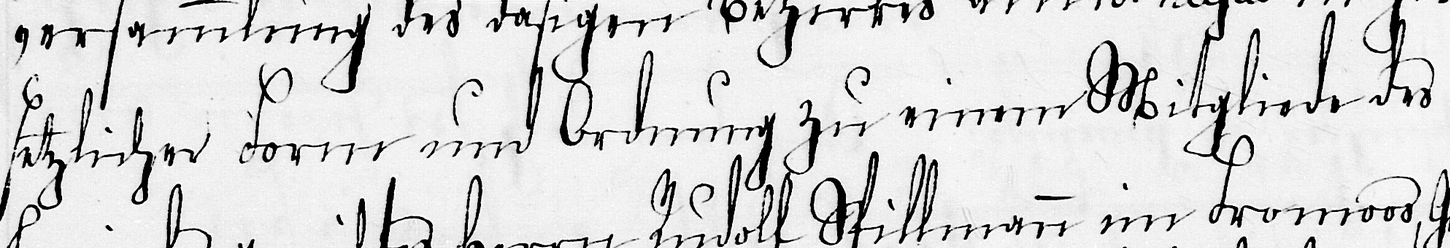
etzlicher Form und Ordnung zu einem Mitgliede des
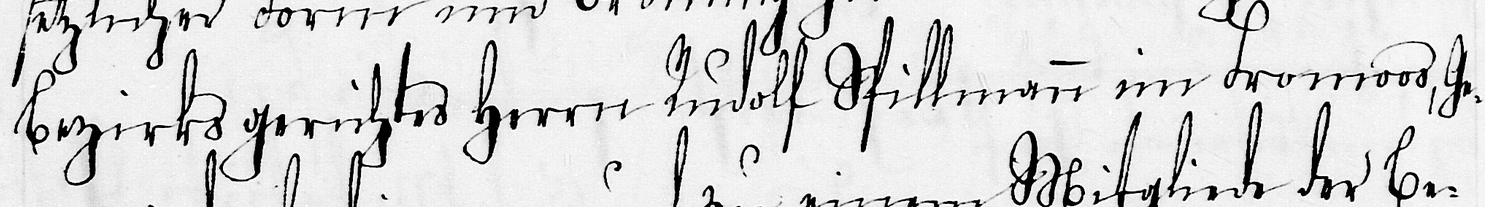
Bezirksgerichtes Herrn Rudolf Spillmann in Fromoos, Ge¬
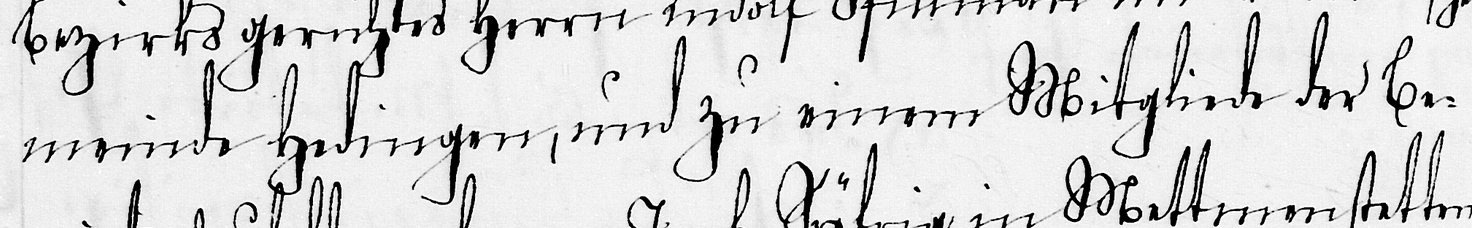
meinde Hedingen, und zu einem Mitgliede der Be¬
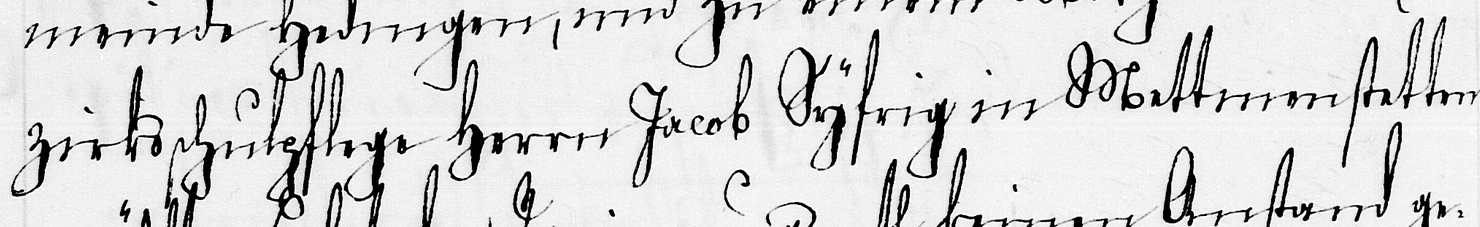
zirksschulpflege Herrn Jacob Syfrig in Mettmenstetten
